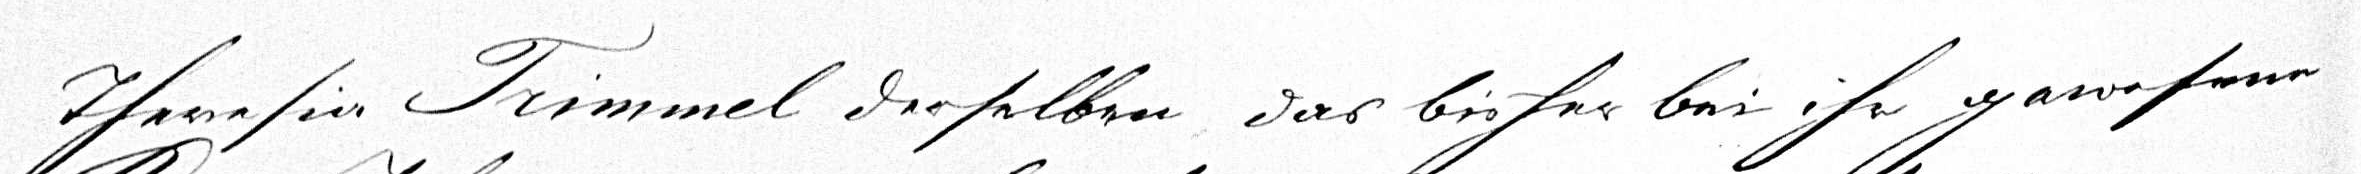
Theresia Trimmel derselben das bisher bei ihr gewesene
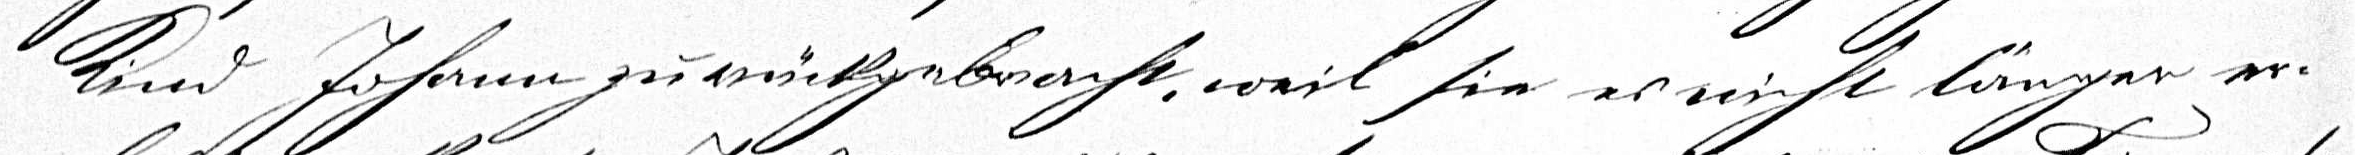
Kind Johann zurückgebracht, weil sie es nicht länger er¬
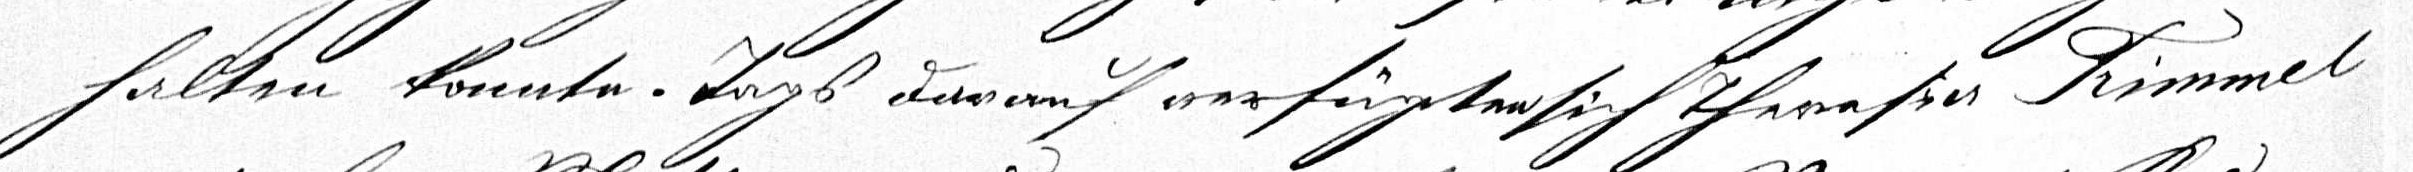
halten konnte. Tags darauf verfügten sich Theresia Kimmel
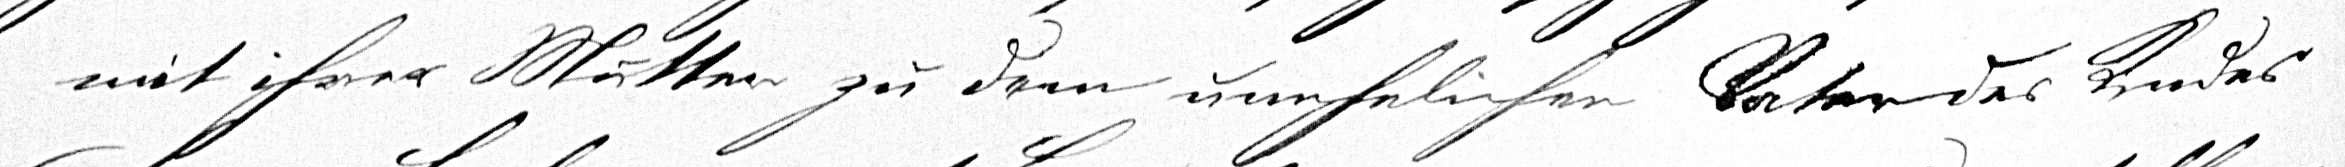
mit ihrer Mutter zu dem unehelichen Vater des Kindes
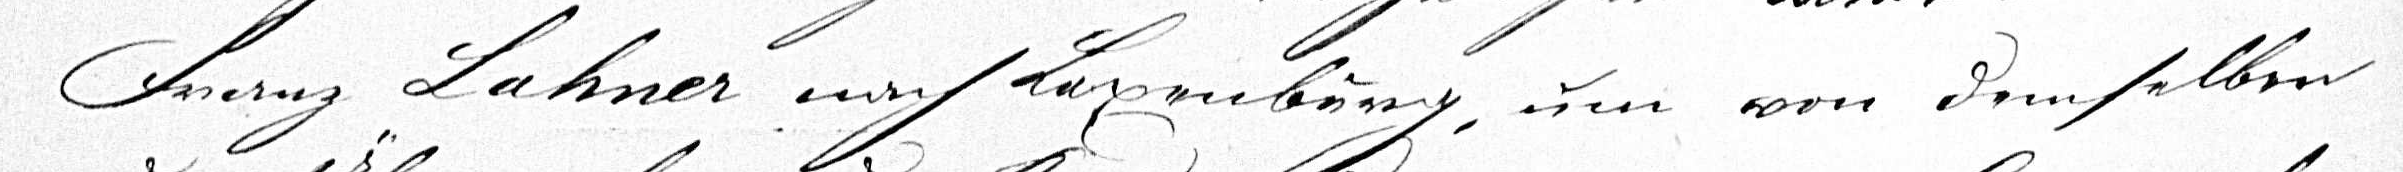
Franz Lahner nach Laxenburg, um von demselben
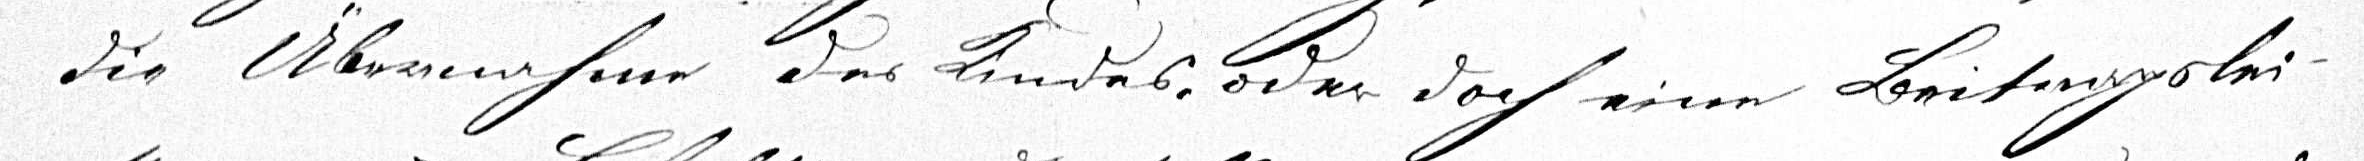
die Übernahme des Kindes, oder doch eine Beitragslei¬
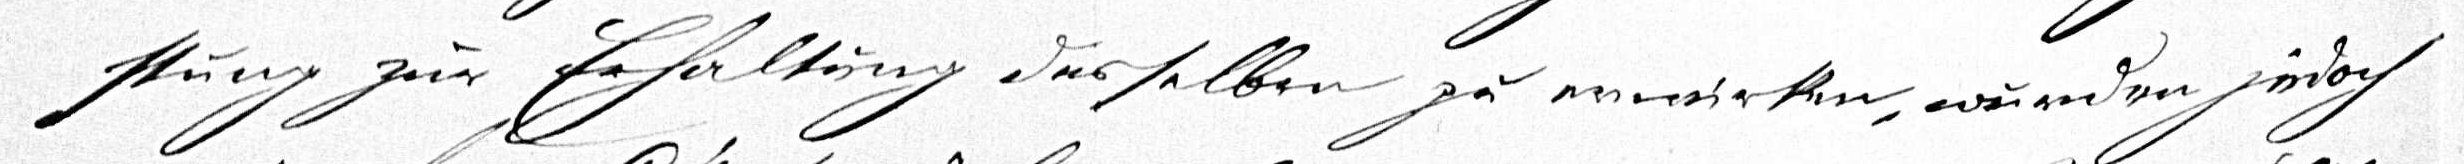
stung zur Erhaltung desselben zu erwirken, wurden jedoch
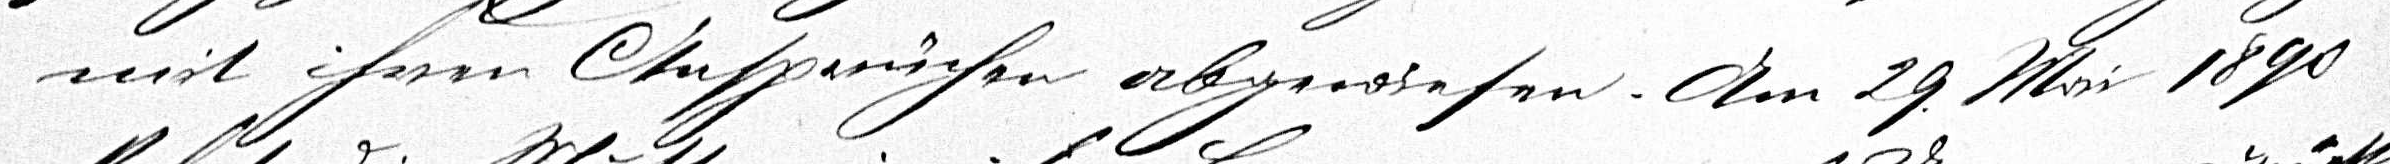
mit ihren Ansprüchen abgewiesen. Am 29. Mai 1890
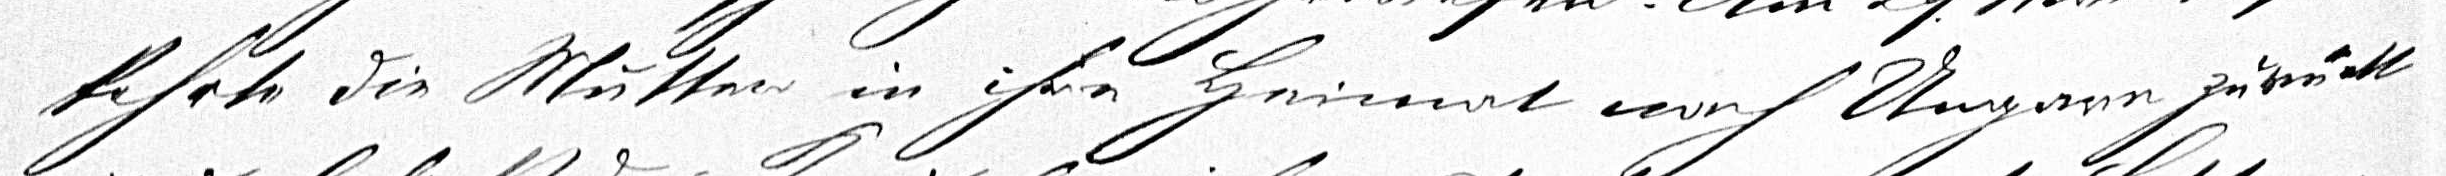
kehrte die Mutter in ihre Heimat nach Ungarn zurück
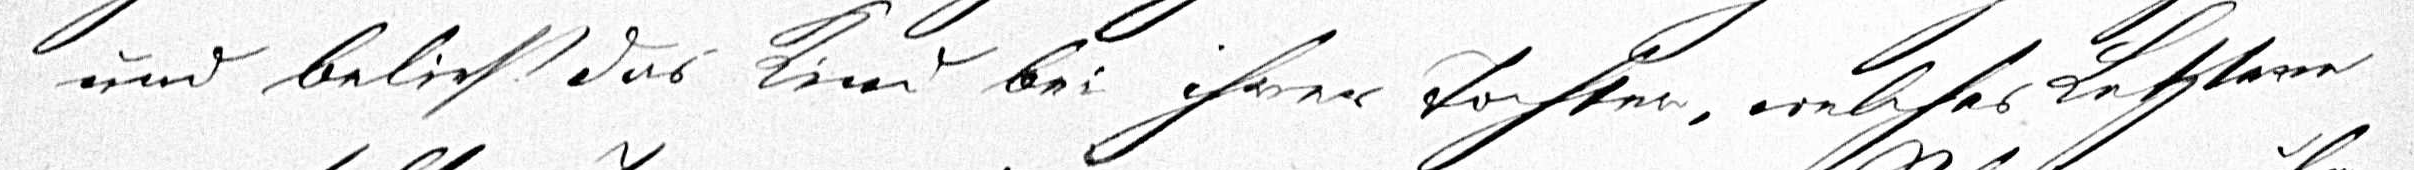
und beließ das Kind bei ihrer Tochter, welches Letztere
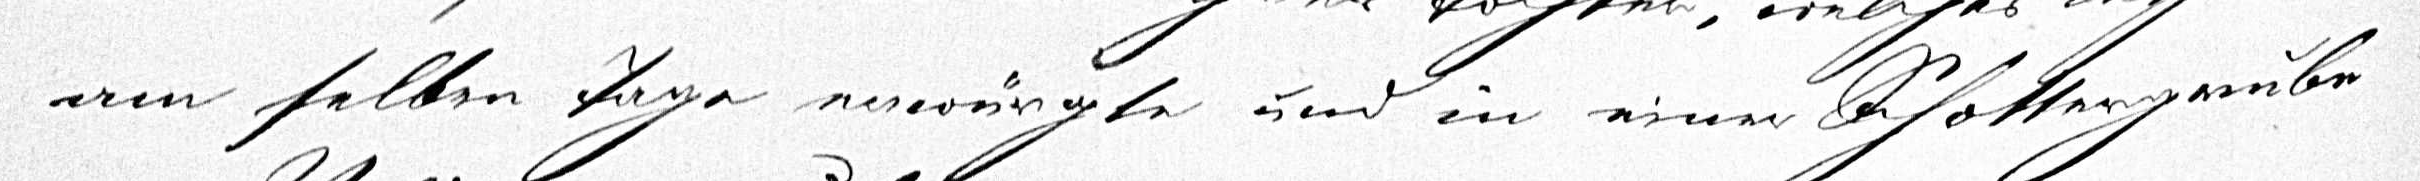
am selben Tage erwürgte und in einer Schottengrube
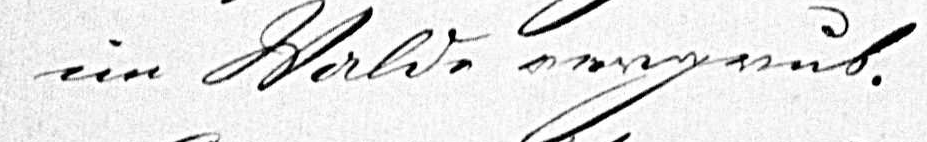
im Walde vergrub.
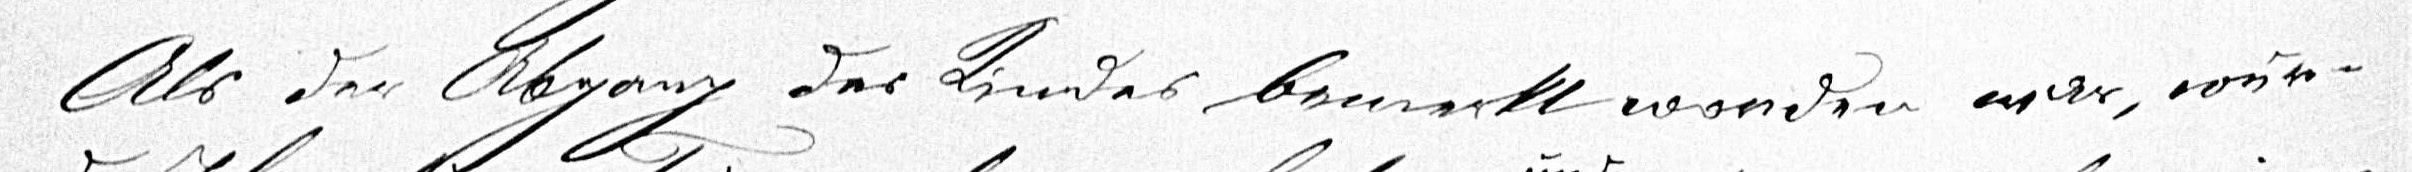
Als der Abgang der Kindes bemerkt worden war, wur¬
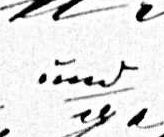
und
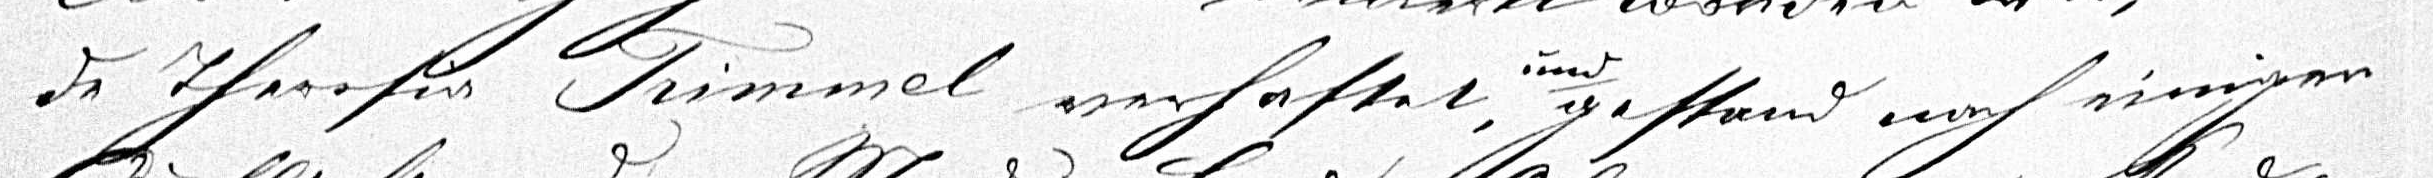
de Theresia Trimmel verhaftet, gestand nach einigen
